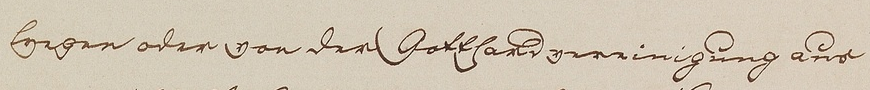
wegen oder von der Gotthardvereinigung aus
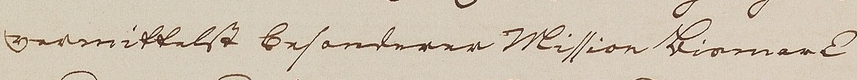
vermittelst besonderer Mission Bismark
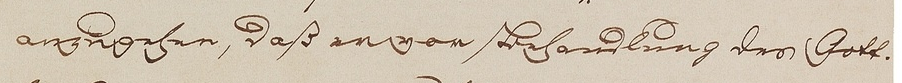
anzugehen, daß er vor Behandlung des Gott-
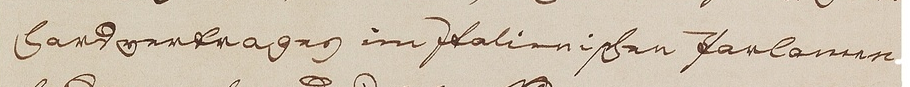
hardvertrages im Italienischen Parlamen-
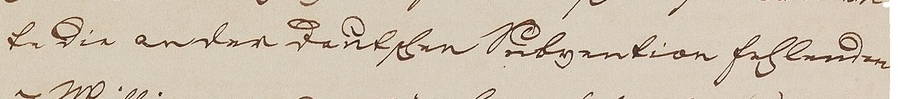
te die an der deutschen Subvention fehlenden
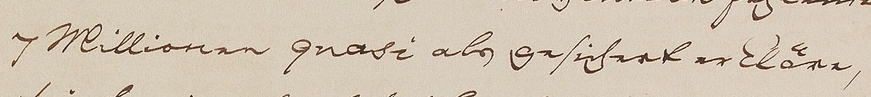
7 Millionen quasi als gesichert erkläre,
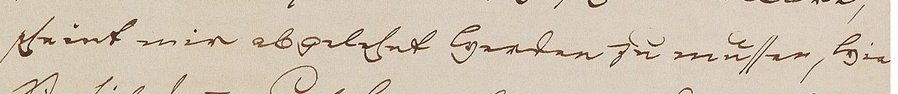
scheint mir abgelehnt werden zu müssen, wie
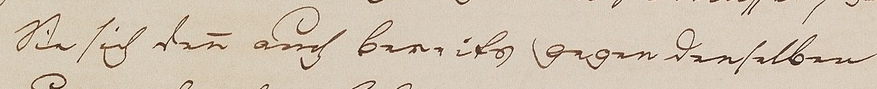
Sie sich denn auch bereits gegen denselben
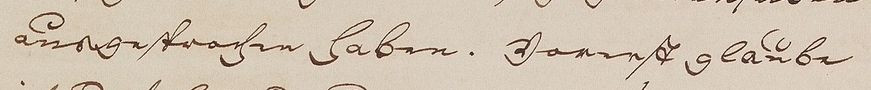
ausgesprochen haben. Vorerst glaube
